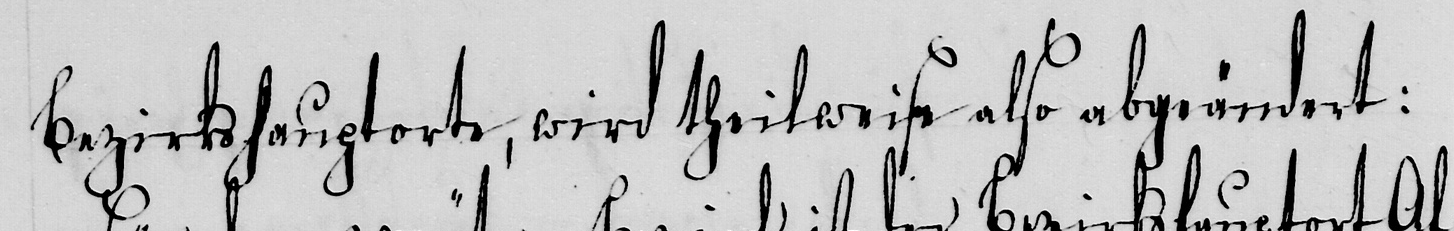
Bezirkshauptorte, wird theilweise also abgeändert:
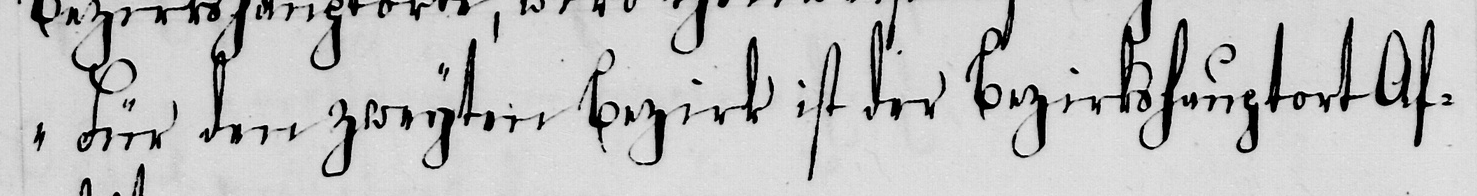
„Für den zweyten Bezirk ist der Bezirkshauptort Af¬
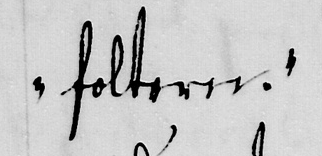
foltern,
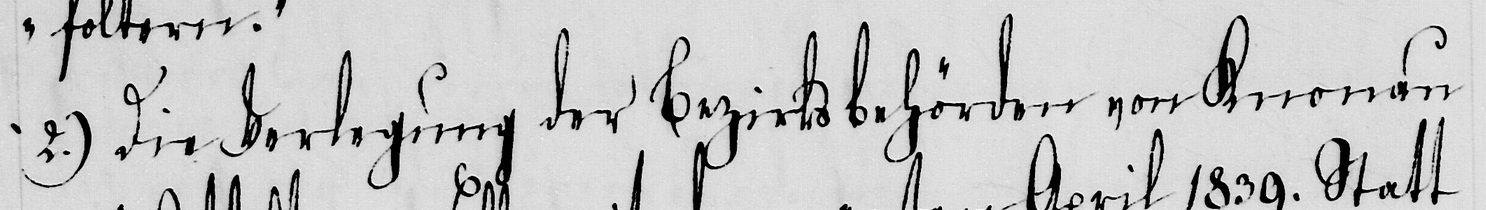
2.) Die Verlegung der Bezirksbehörden von Knonau
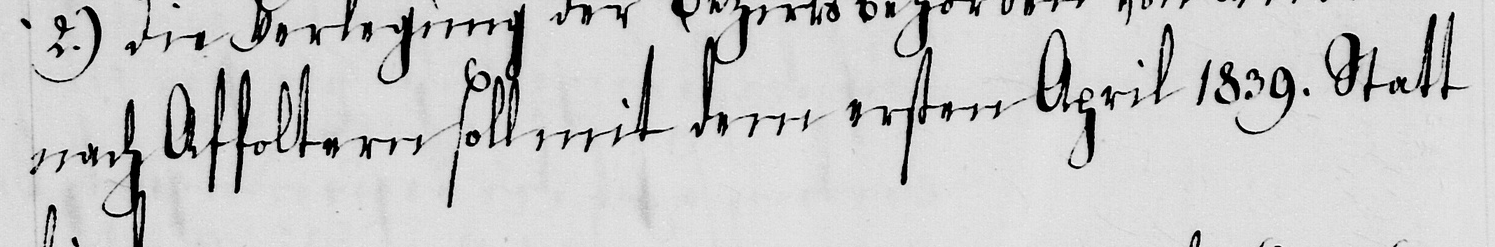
nach Affoltern soll mit dem ersten April 1839. Statt
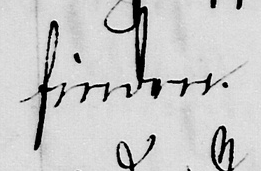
finden.
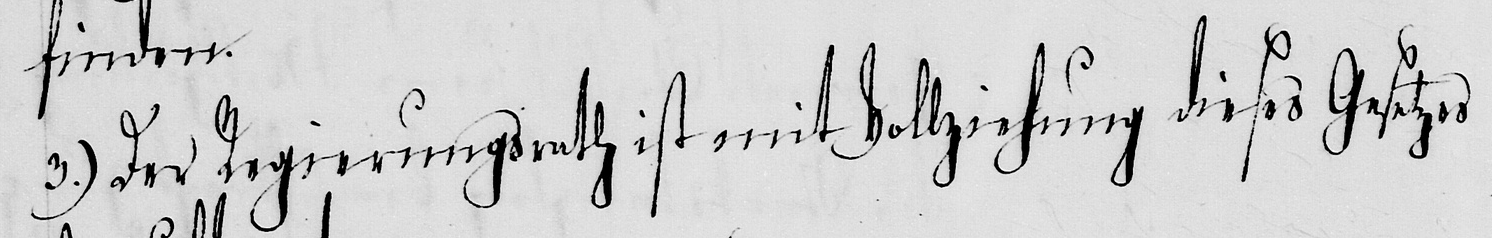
3.) Der Regierungsrath ist mit Vollziehung dieses Gesetz¬
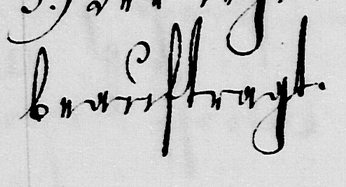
beauftragt.
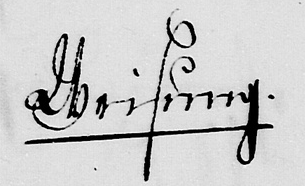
Weisung.
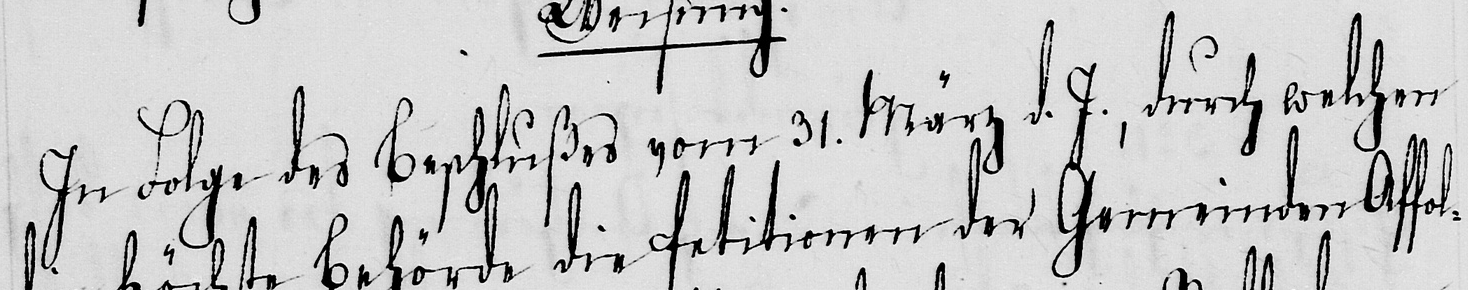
In Folge des Beschlußes vom 31. März d. J., durch welchen
